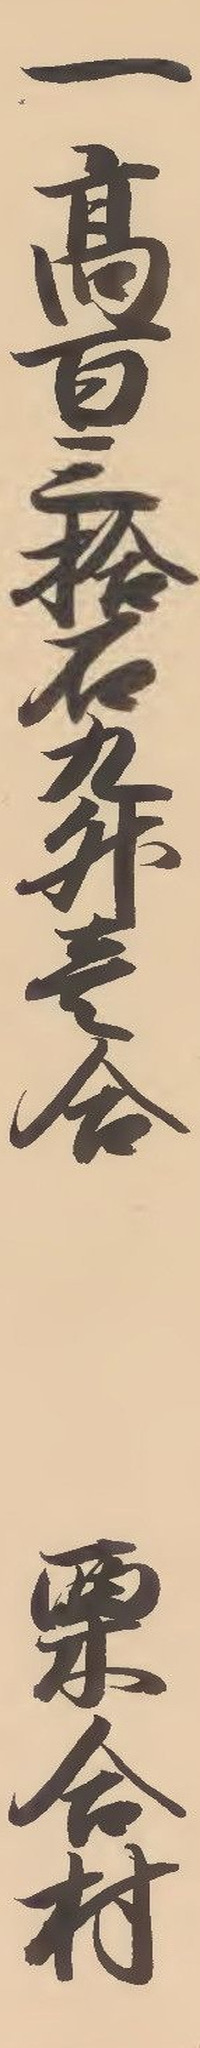一高百三拾石九升壱合栗合村
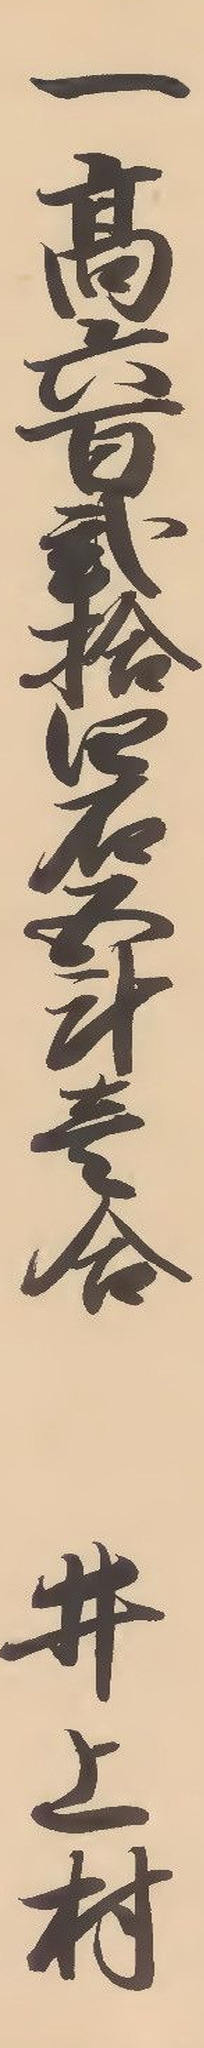一高六百弐拾四石五斗壱合井上村
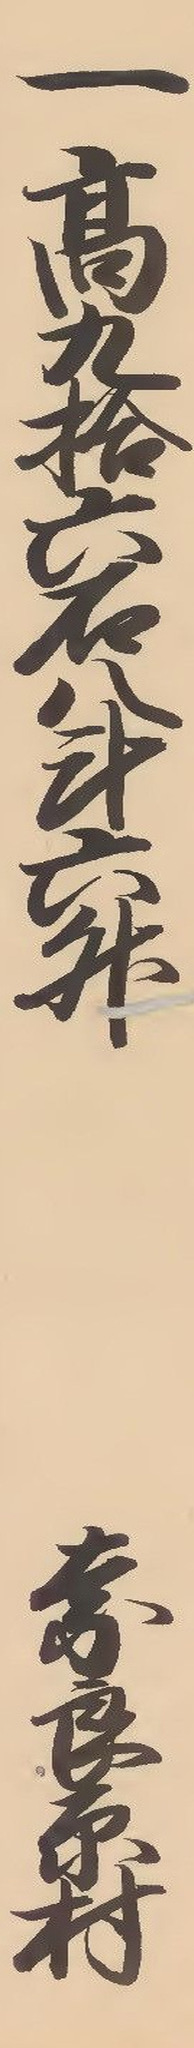一高九拾六石八斗六升奈良原村
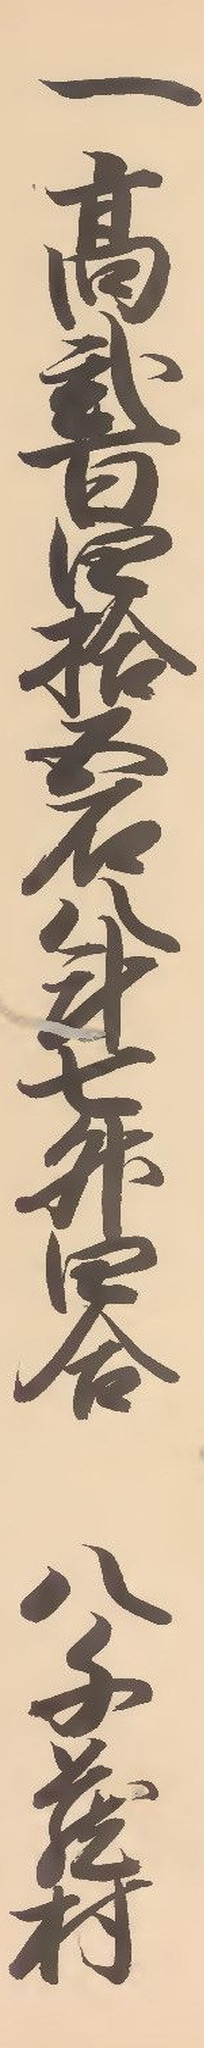一高弐百四拾五石八斗七升四合八千蔵村
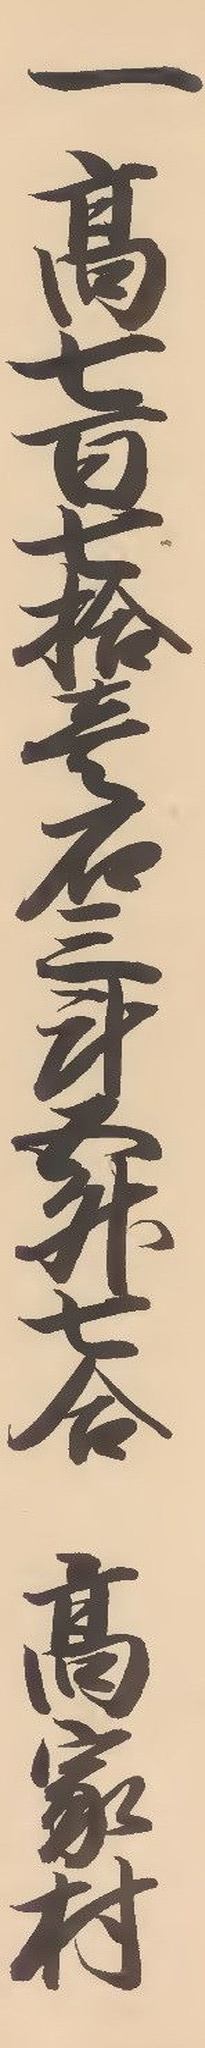一高七百七拾壱石三斗五升七合高家村
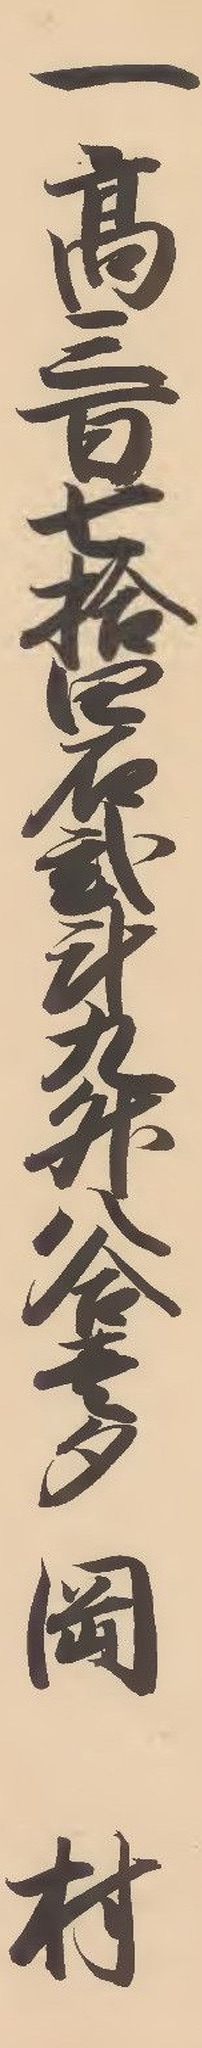一高三百七拾四石弐斗九升八合壱勺岡村
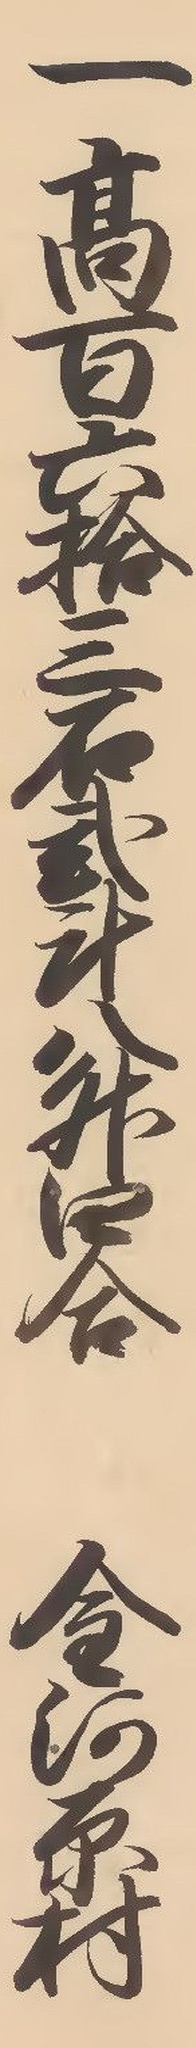一高百六拾三石弐斗八升四合金河原村

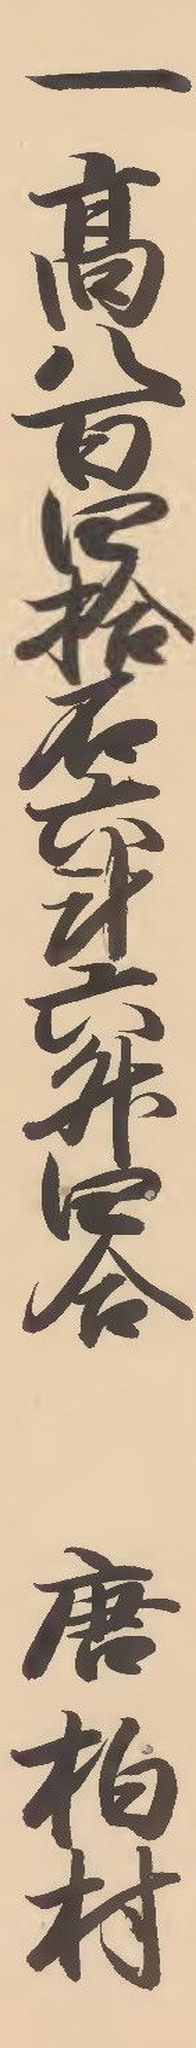一高八百四拾石六斗六升四合唐柏村
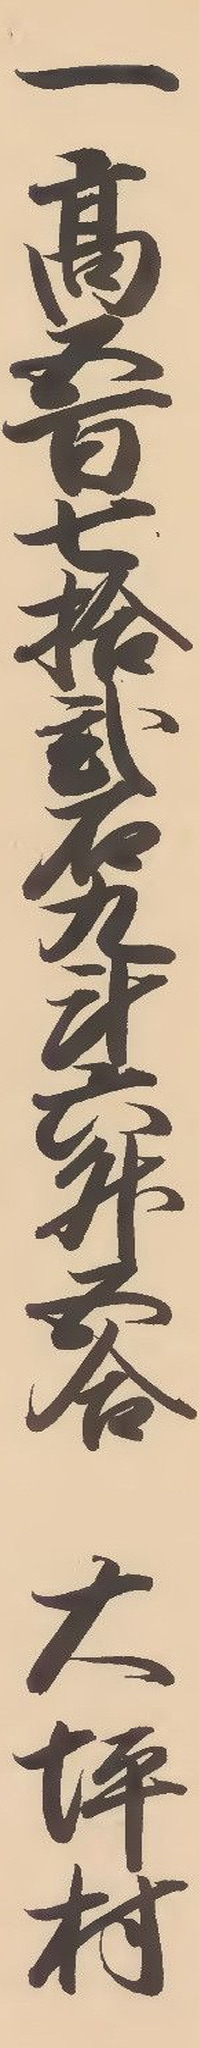一高五百七拾弐石九斗六升五合大坪村
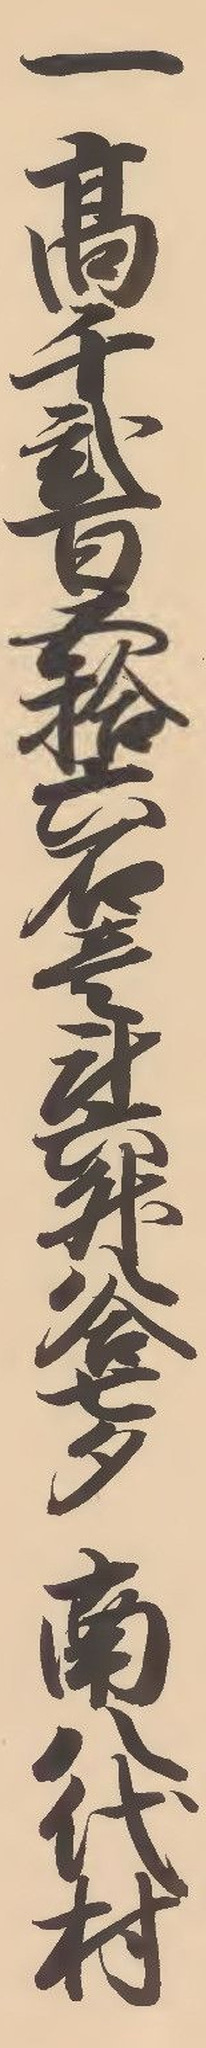一高千弐百五拾六石壱斗六升八合七勺南八代村
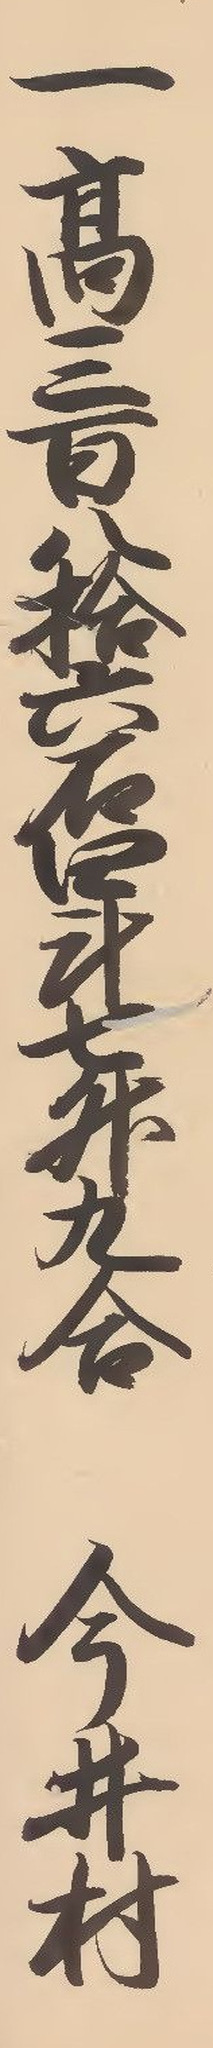一高三百八拾六石四斗七升九合今井村
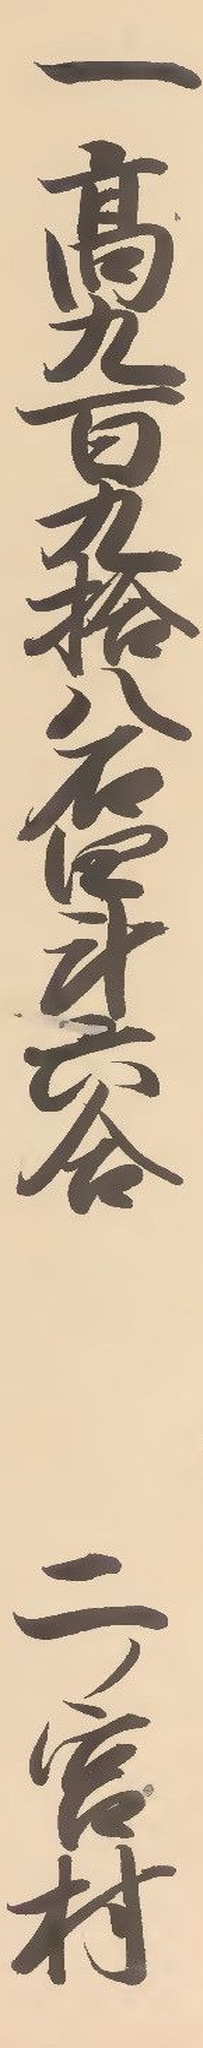一高九百九拾八石四斗六合二ノ宮村
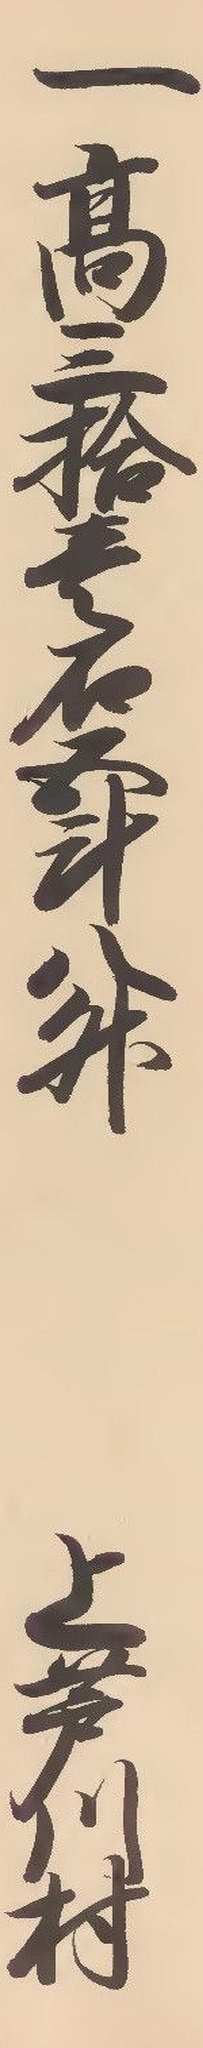一高三拾壱石五斗八升上芦川村
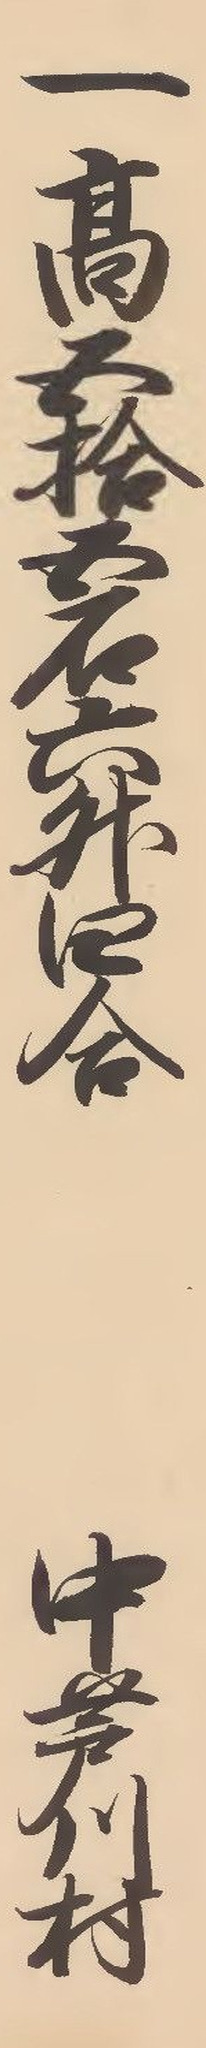一高五拾五石六升四合中芦川村
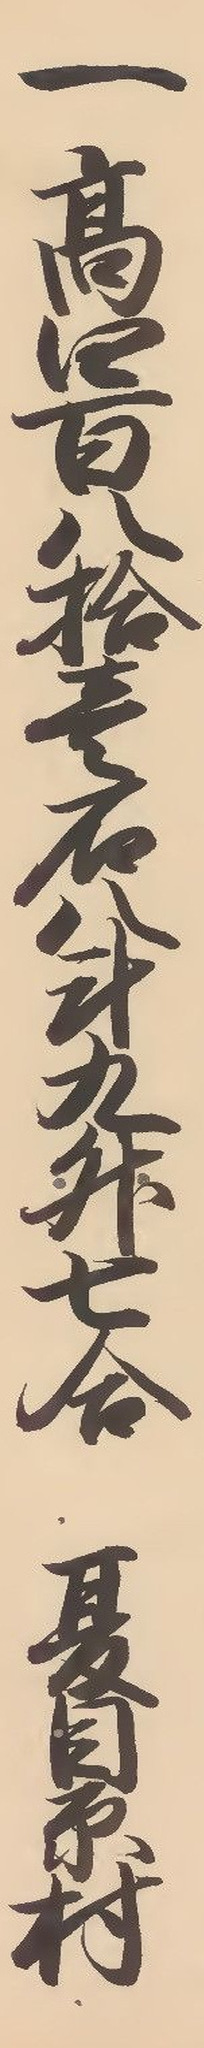一高四百八拾壱石八斗九升七合夏目原村

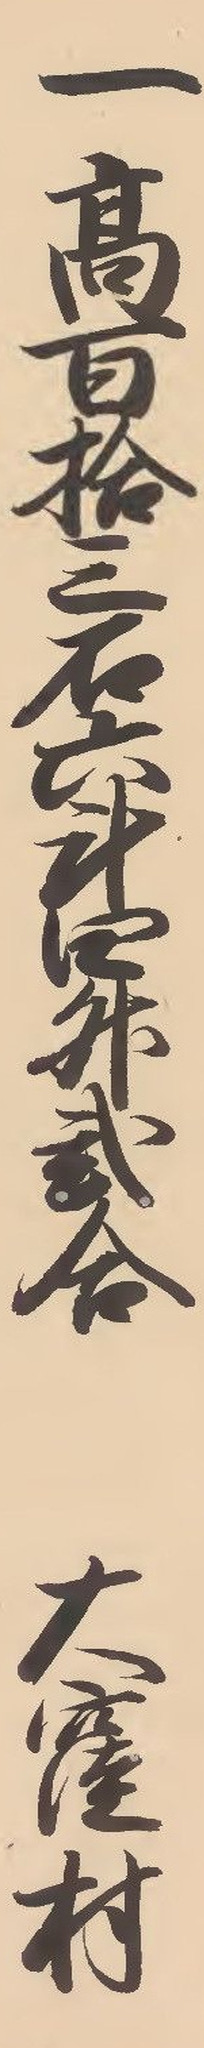一高百拾三石六斗四升弐合大窪村
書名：甲斐国郷帳
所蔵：国立公文書館 National Archives of Japan
